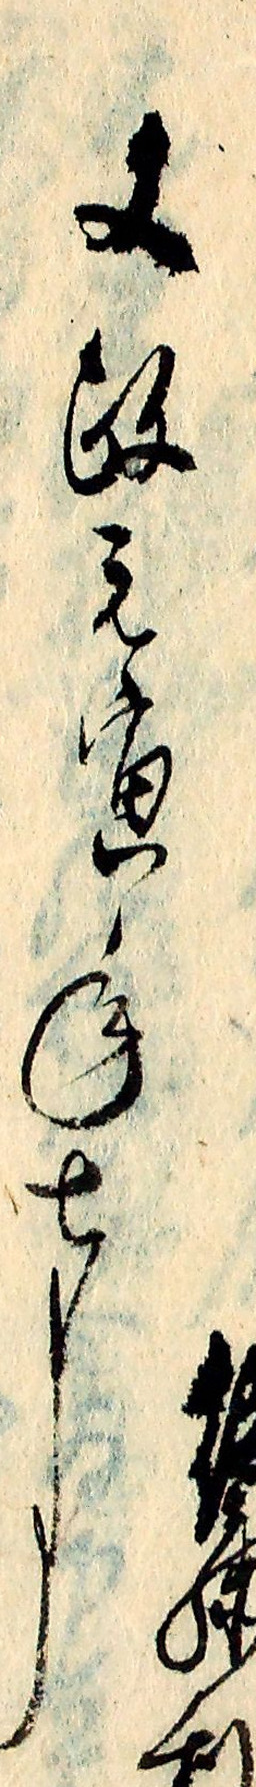文政元寅年七月
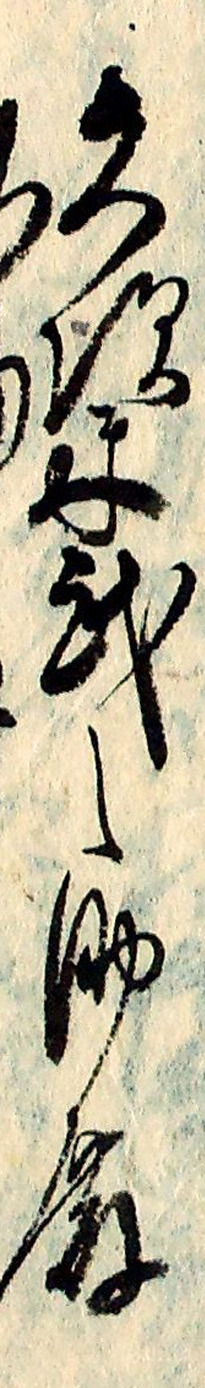久須米武之助殿
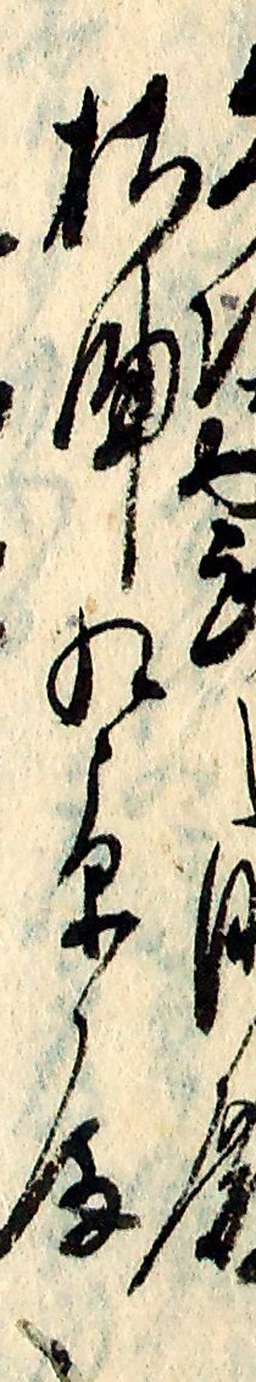松浦九兵衛殿
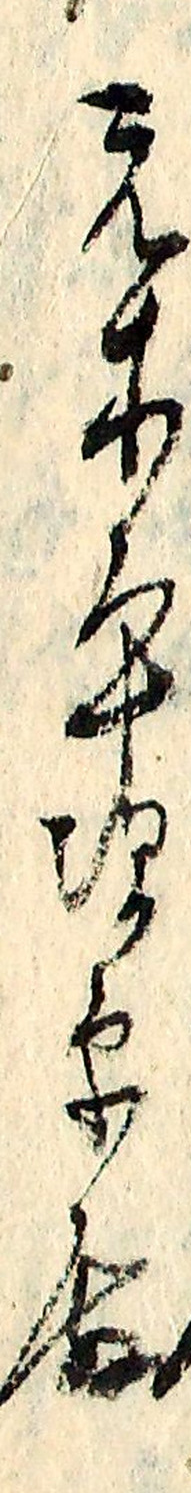元木平次兵衛殿

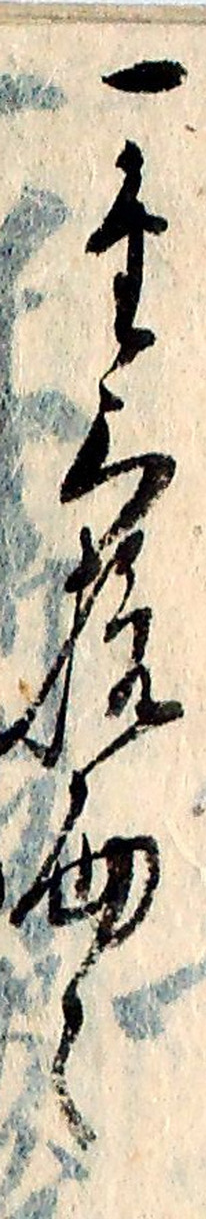一金三拾両也
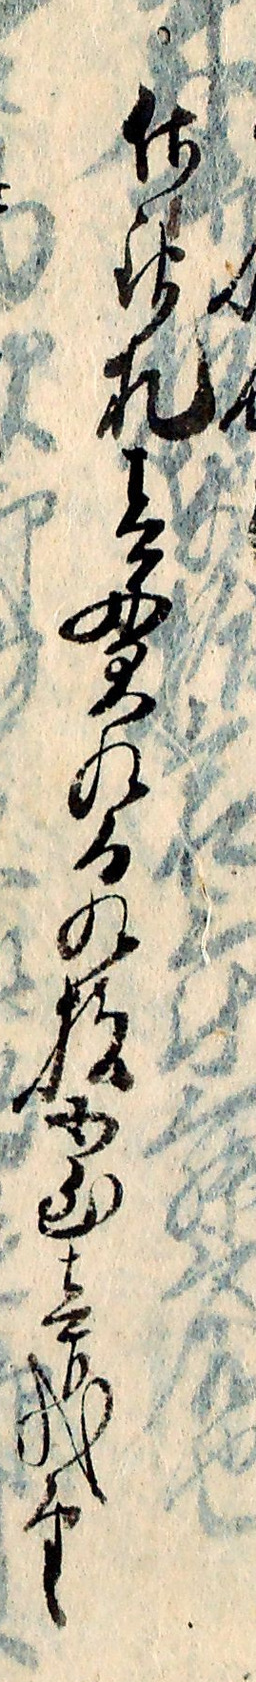代銀札壱貫九百九拾五匁壱分弐厘
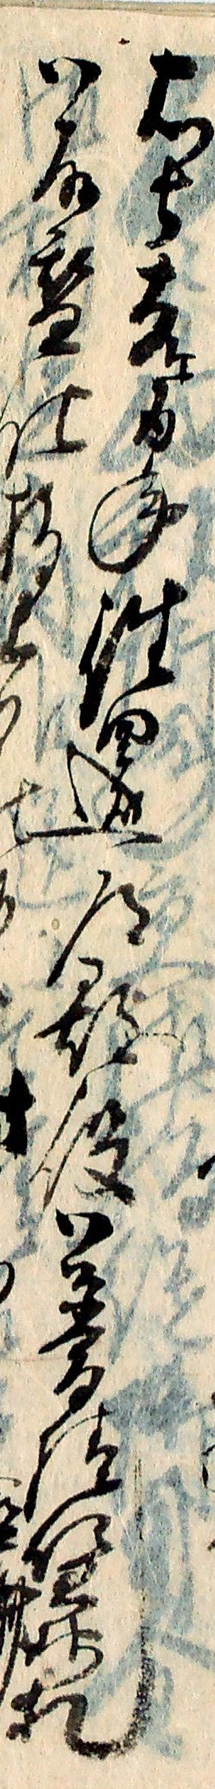右は去る酉年往還道郡役御普請賃銀札
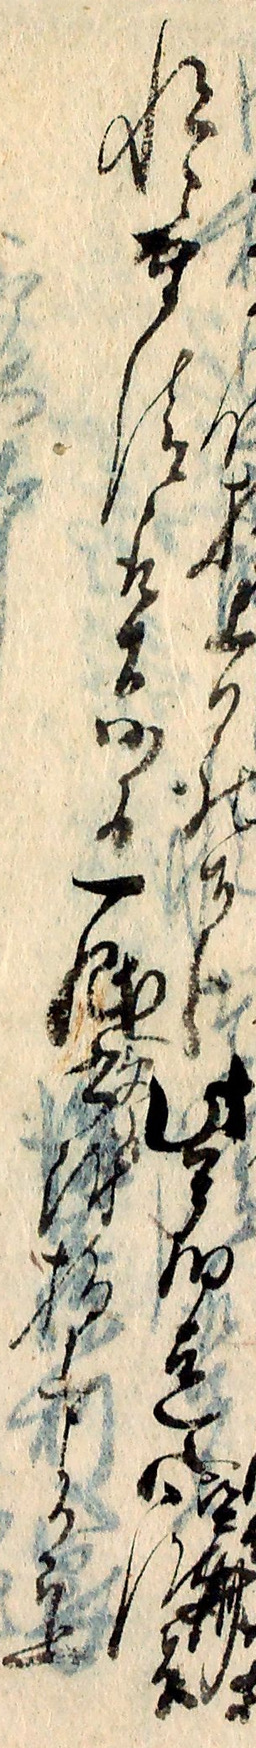慥に奉請取候仍て一紙書附指上申候已上
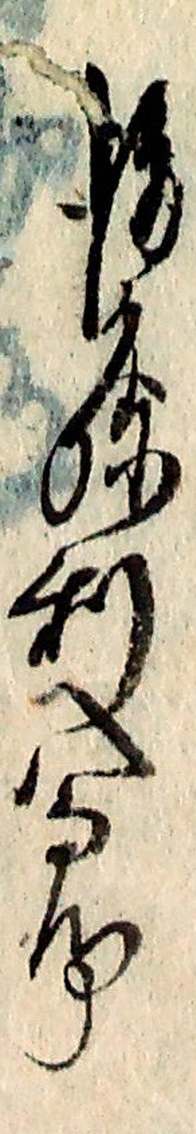後藤利八郎
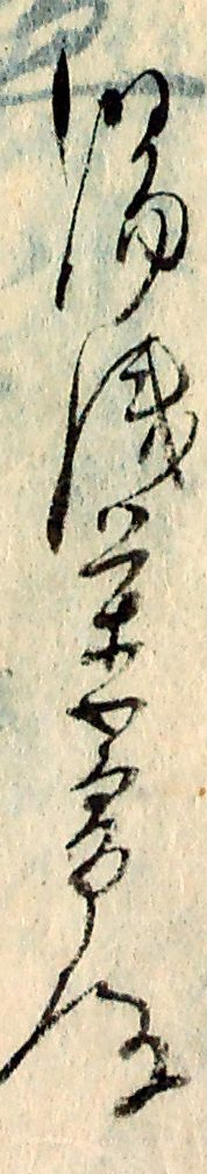湯浅栄五郎殿

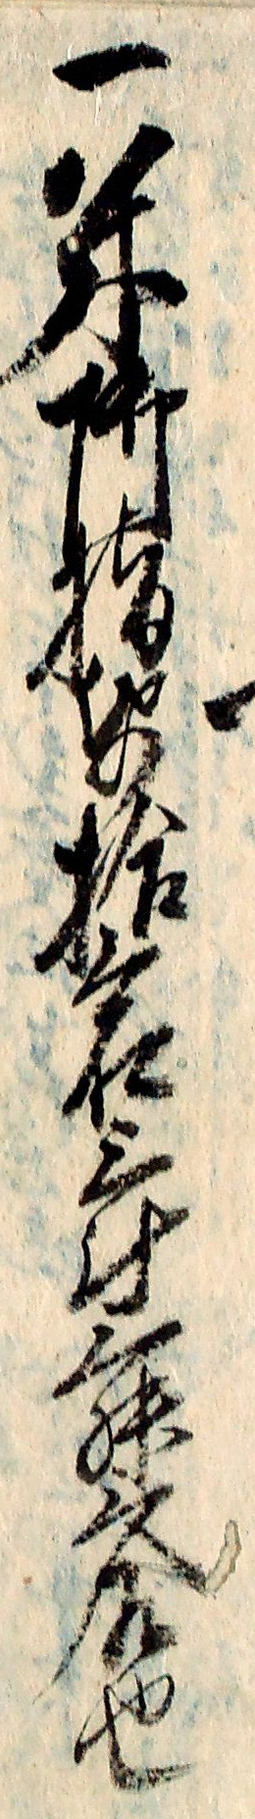一米御指紙拾三石三斗三升三合也
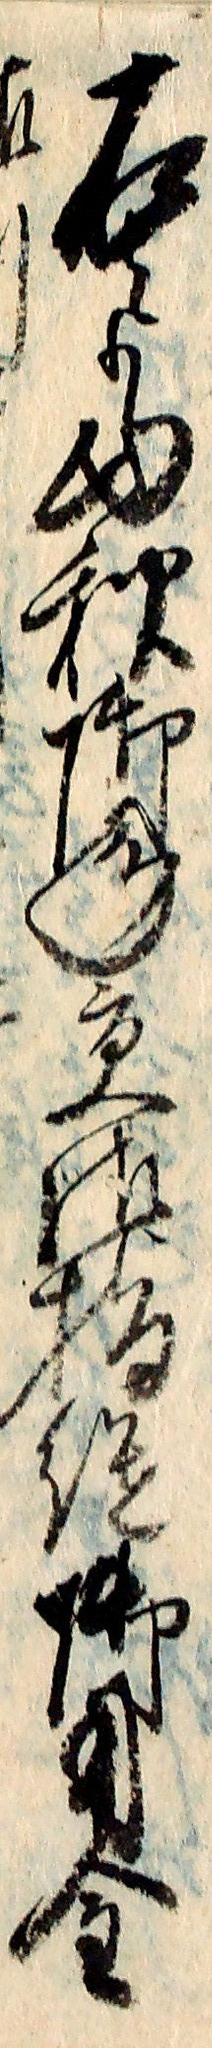右は当秋御年貢御指継御用金
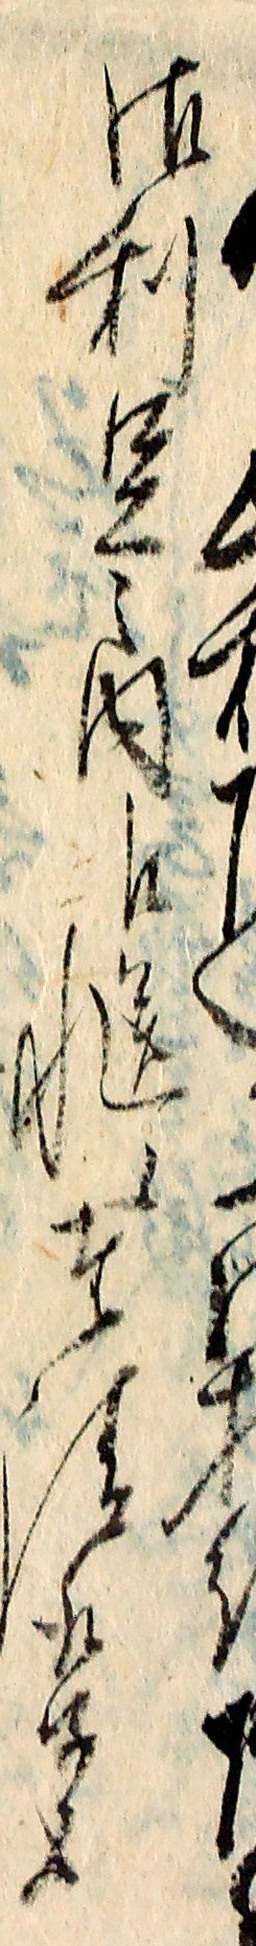御利足之内え慥に奉請取候以上
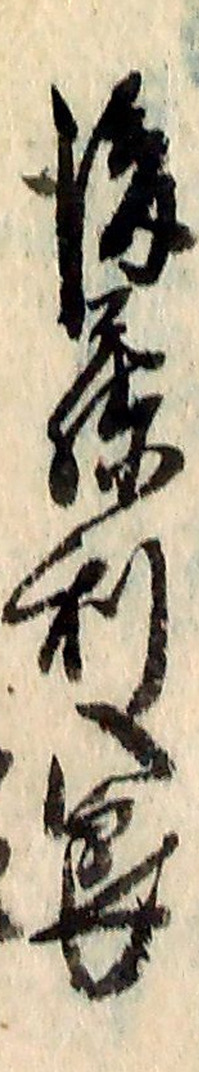後藤利八郎
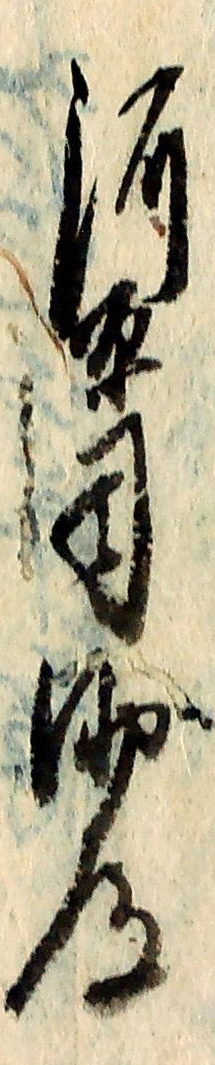河原周助殿
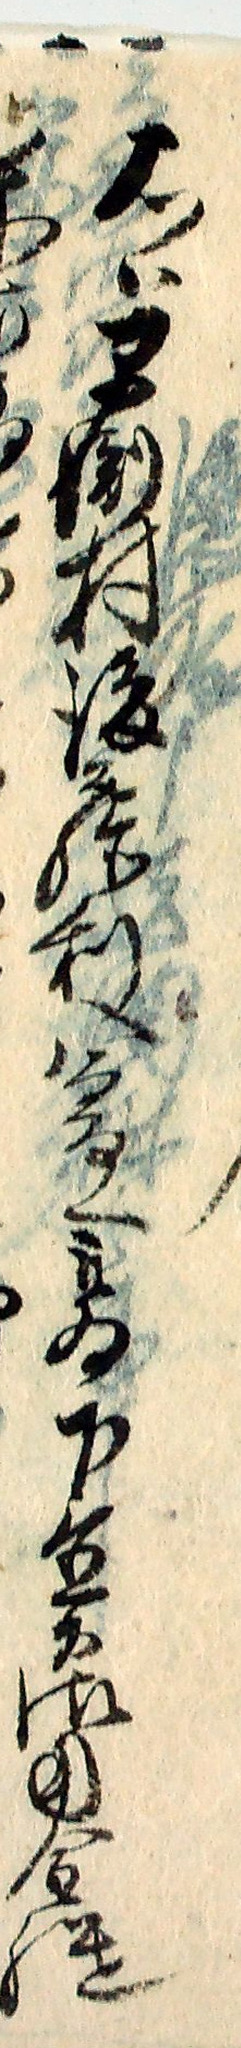右は早淵村後藤利八郎へ被為下置候御用金継
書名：諸御願書控(後藤氏壱番）
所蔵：鳴門教育大学 Naruto University of Education
